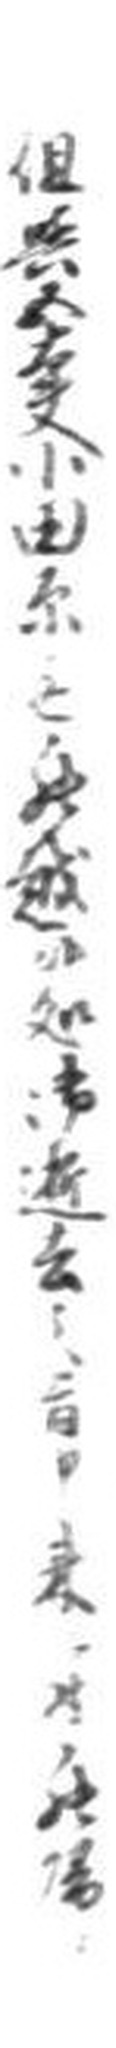但與五太夫小田原迄罷越候処御逝去之旨申来候ニ付罷帰
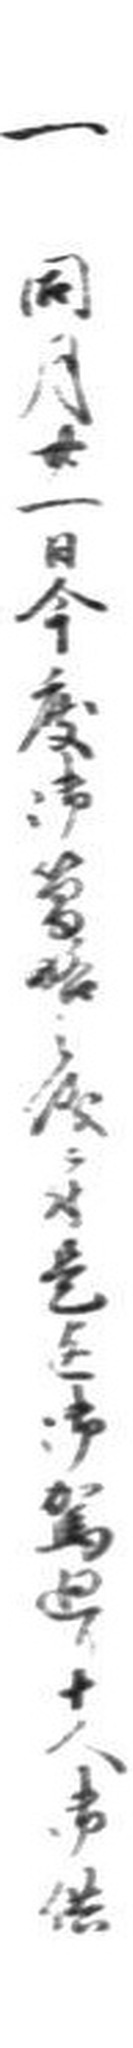一同月廿一日今度御簡略之儀ニ付是迄御駕廻り十人御供
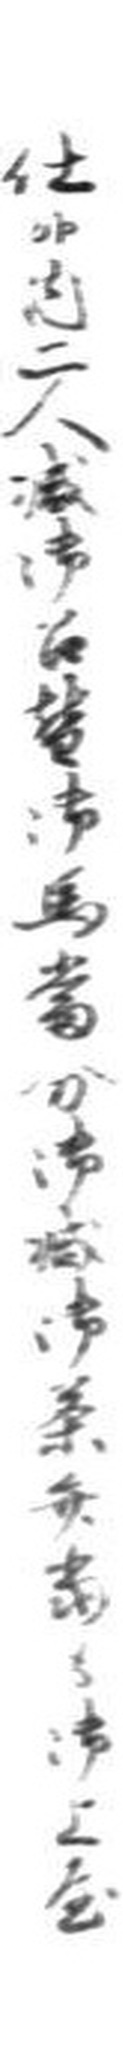仕候内二人減御召替御馬当分御減御茶弁当も御上屋
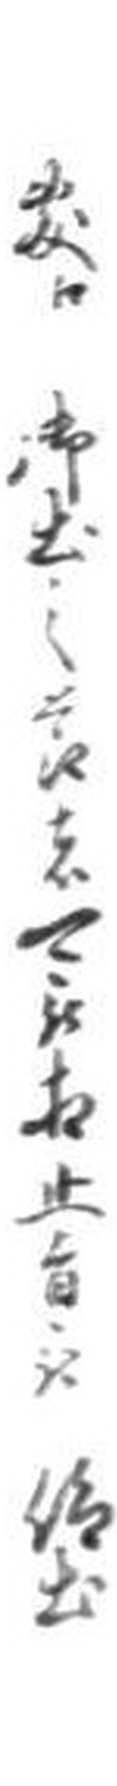敷江御出之節者可被相止旨被仰出

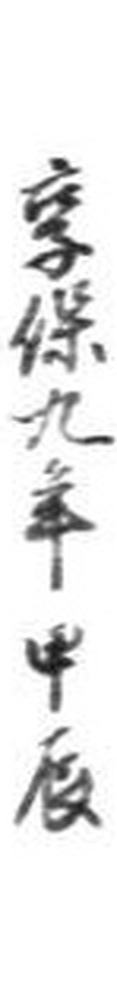享保九年甲辰
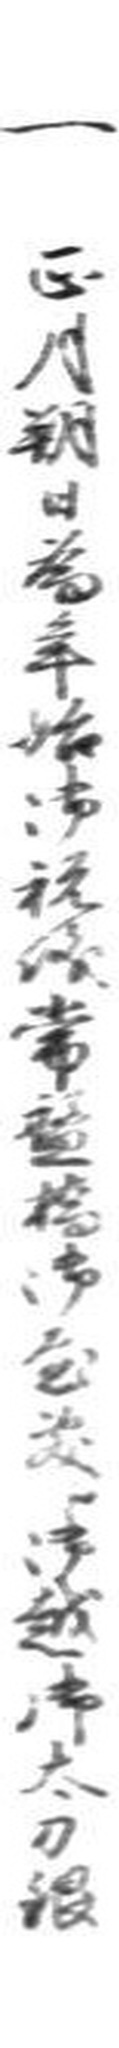一正月朔日為年始御祝儀常盤橋御屋敷江御越御太刀銀
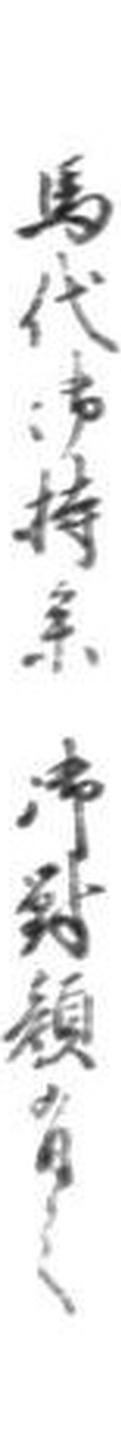馬代御持参御対顔有之
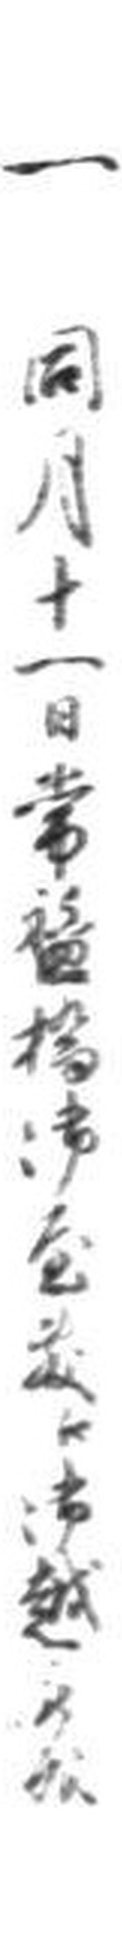一同月十一日常盤橋御屋敷江御越被成
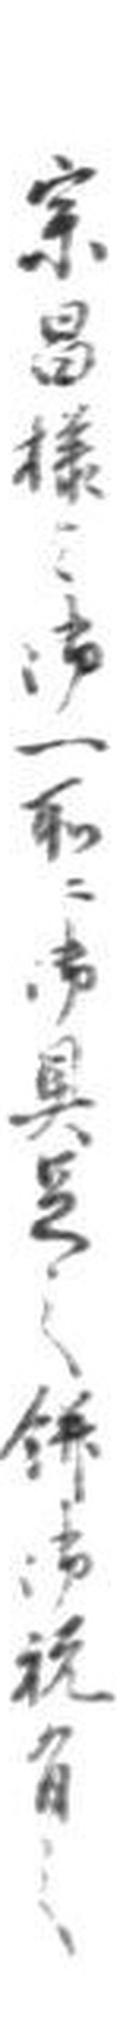宗昌様と御一所ニ御具足之餅御祝有之
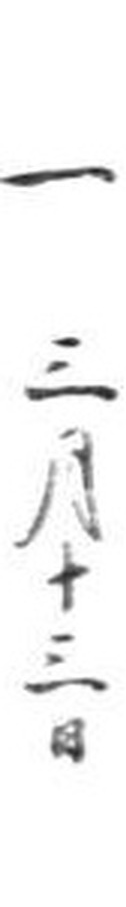一三月十三日
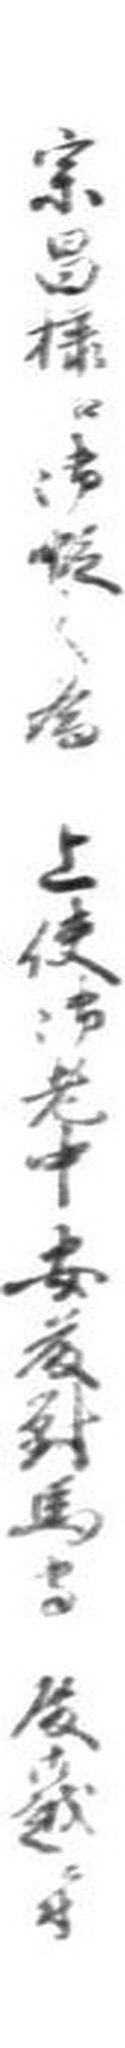宗昌様江御暇之為上使御老中安藤対馬守殿御越二付

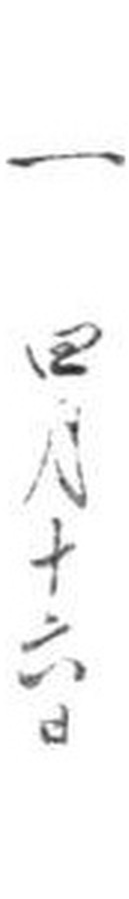一四月十六日
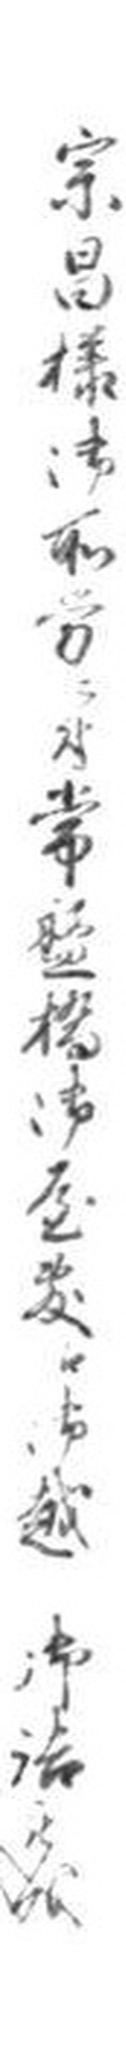宗昌様御所労ニ付常盤橋御屋敷江御越御詰被成
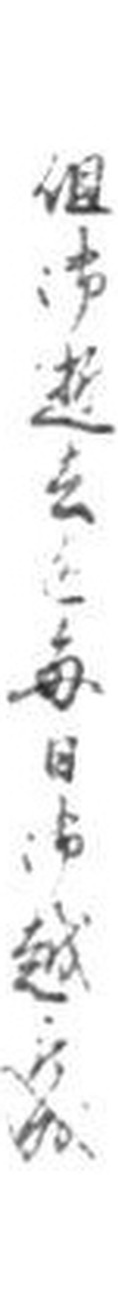但御逝去迄毎日御越被成
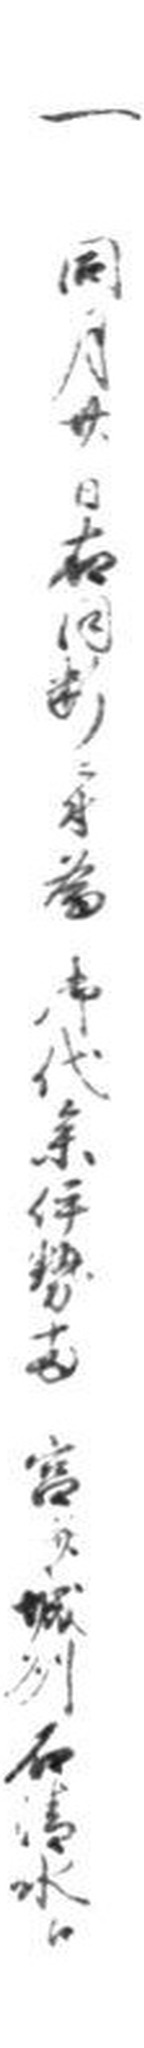一同月廿日右同断ニ付為御代参伊勢両宮并城州石清水江
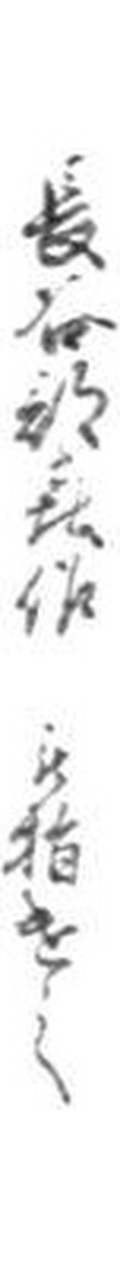長谷部喜作被指遣之
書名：家譜 三十七 宗矩公 従正徳五年到享保九年五月
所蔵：福井県文書館 Fukui Prefectural Archives
